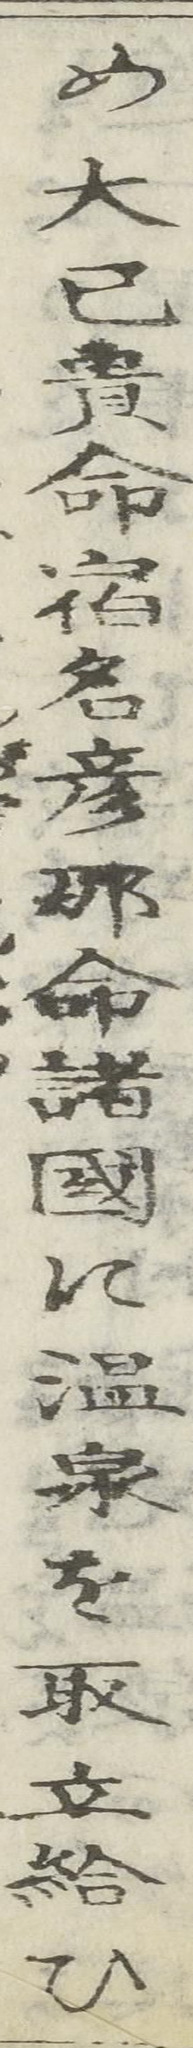め大已貴命宿名彦那命諸国に温泉を取立給ひ
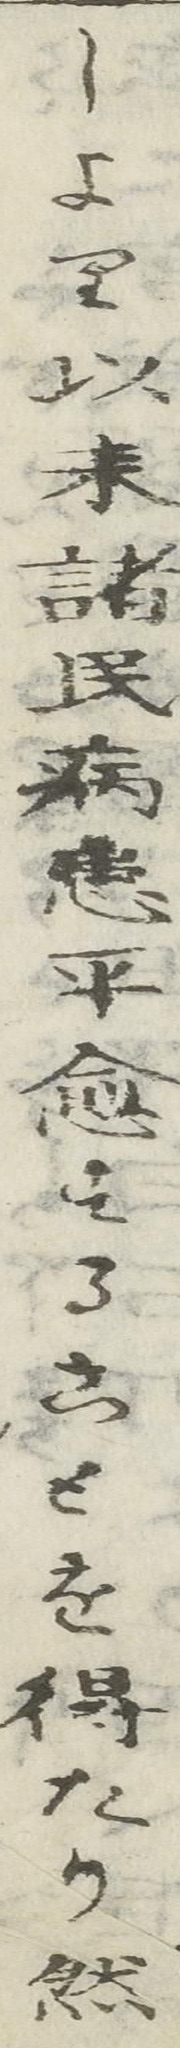しより以来諸民病患平愈することを得たり然
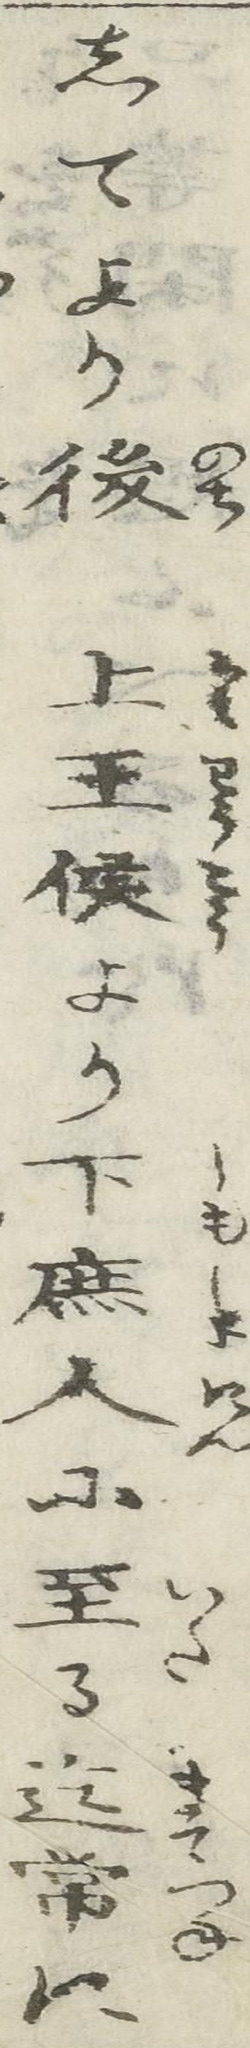してより後上王候より下庶人に至る迄常に
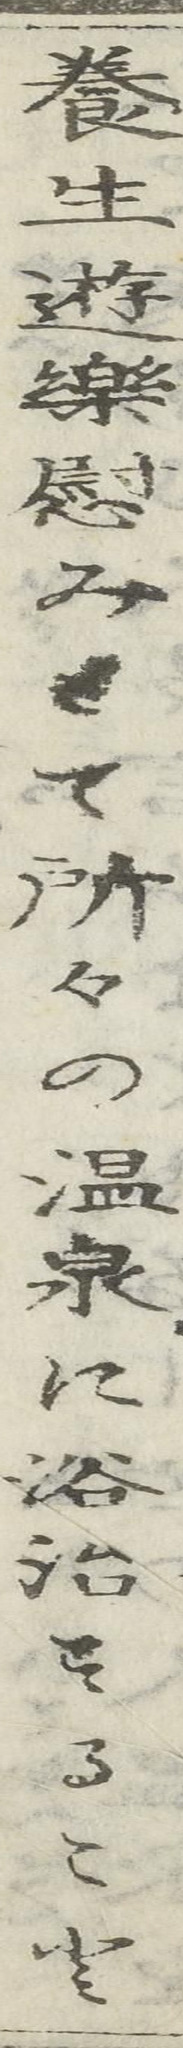養生遊楽慰みもて所々の温泉に浴治するとや
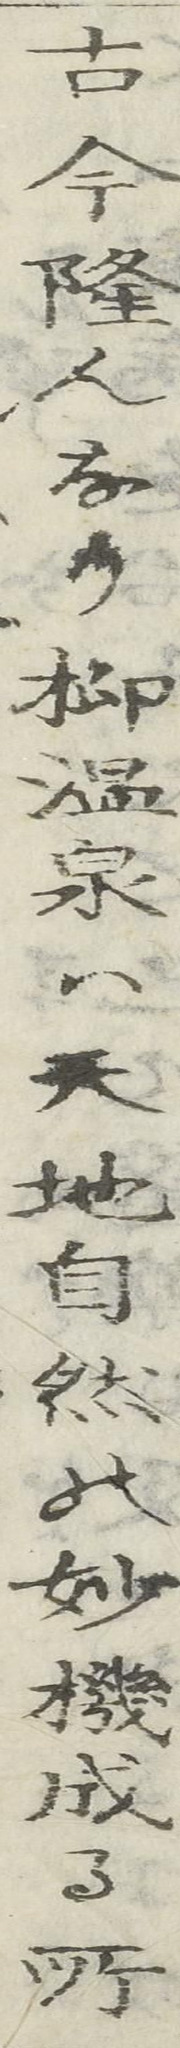古今隆んなり抑温泉は天地自然の妙機成る所
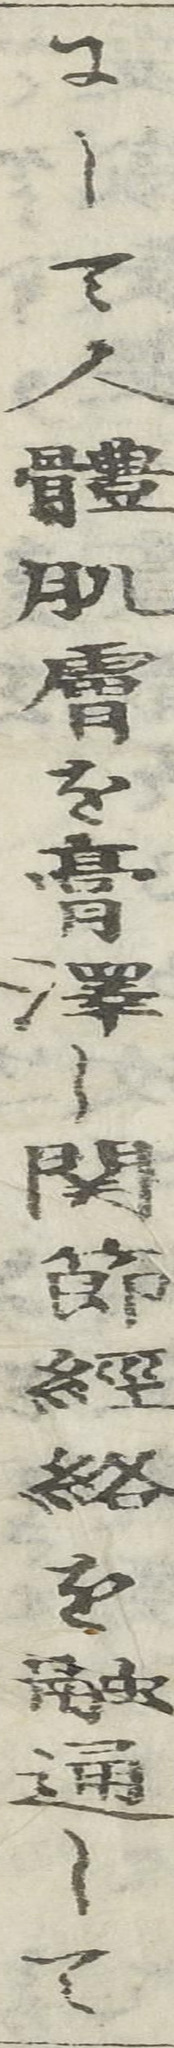まして人体肌膚を膏沢し関節経絡を融通して

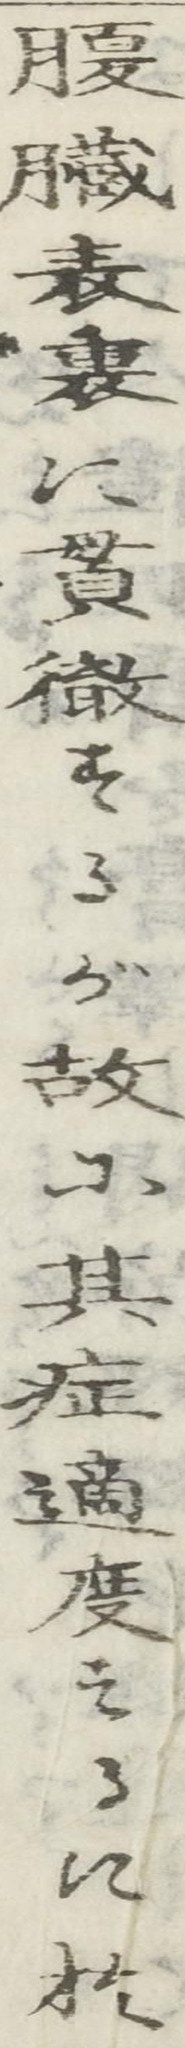腹臓表裏に貫徹するが故に其症適度するに於
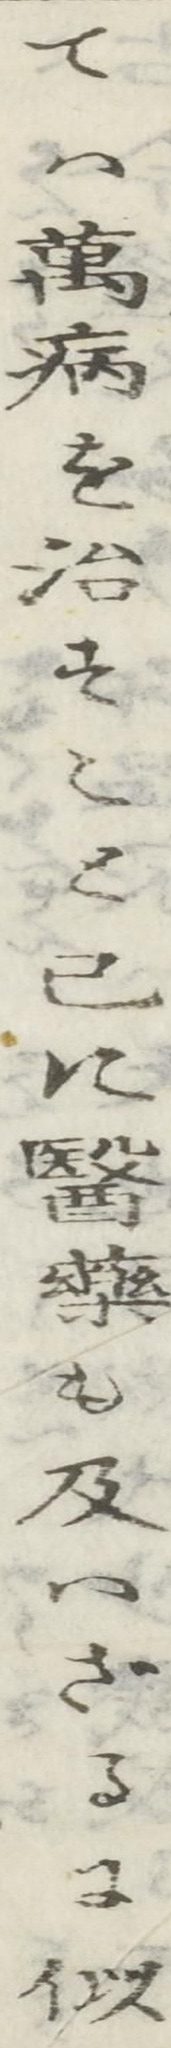ては万病を治すとは已に医薬も及はざるに似
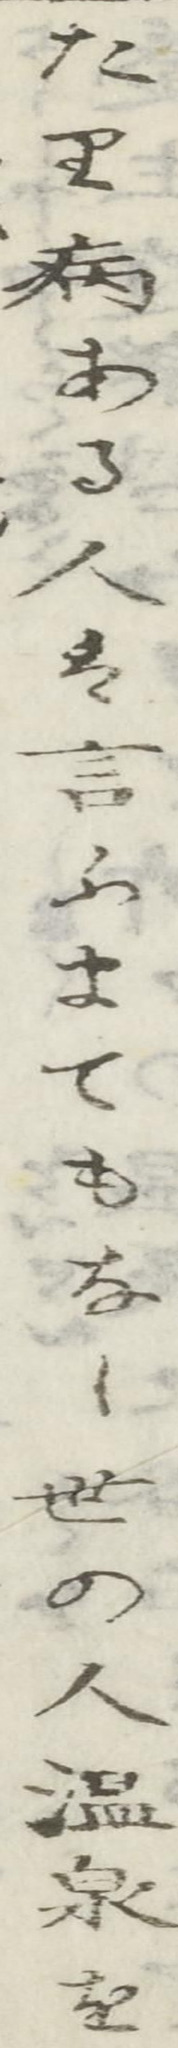たり病ある人は言ふまてもなし世の人温泉を
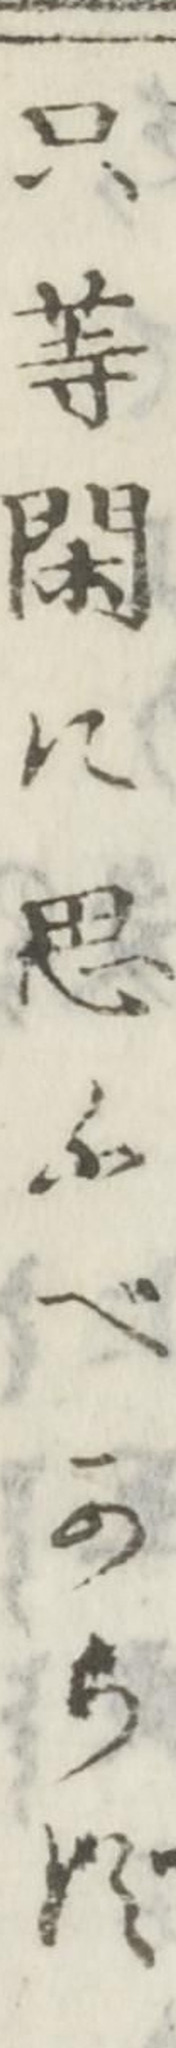只等閑に思ふべからず
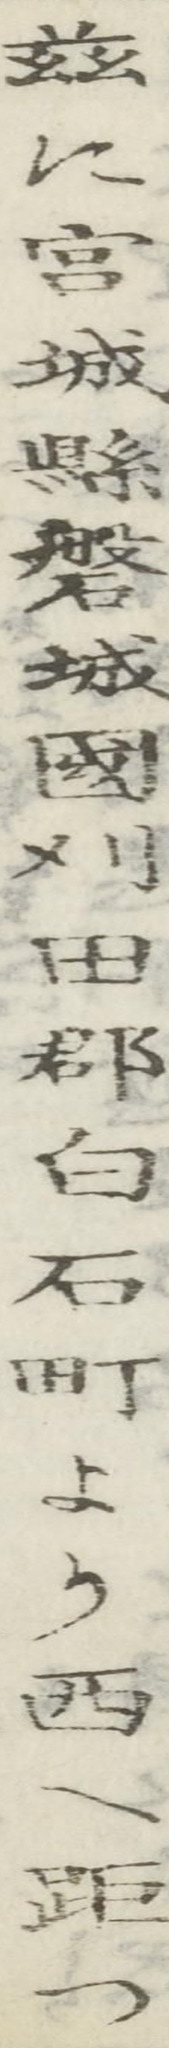茲に宮城県磐城国刈田郡白石町より西へ距つ
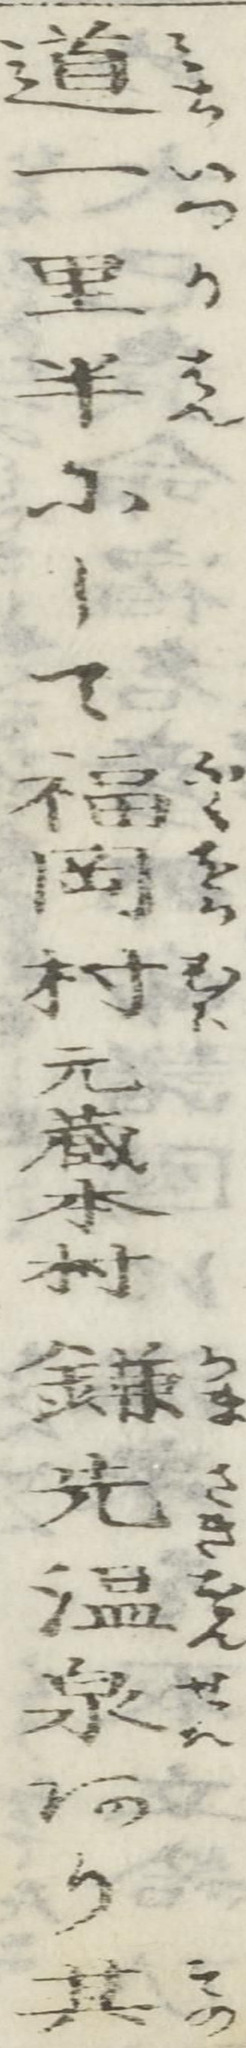道一里半にして福岡村元蔵本村鎌先温泉あり其
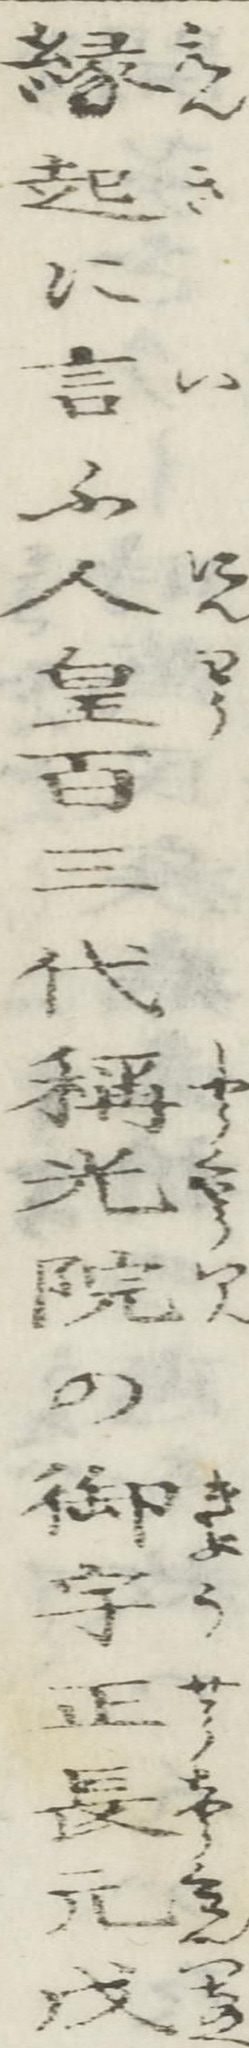縁起に言ふ人皇百三代称光院の御宇正長元戊
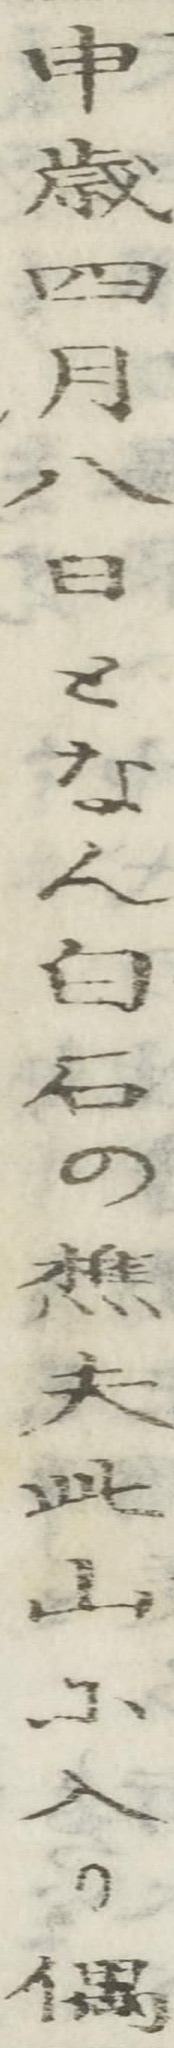申歳四月八日となん白石の樵夫此山に入り偶
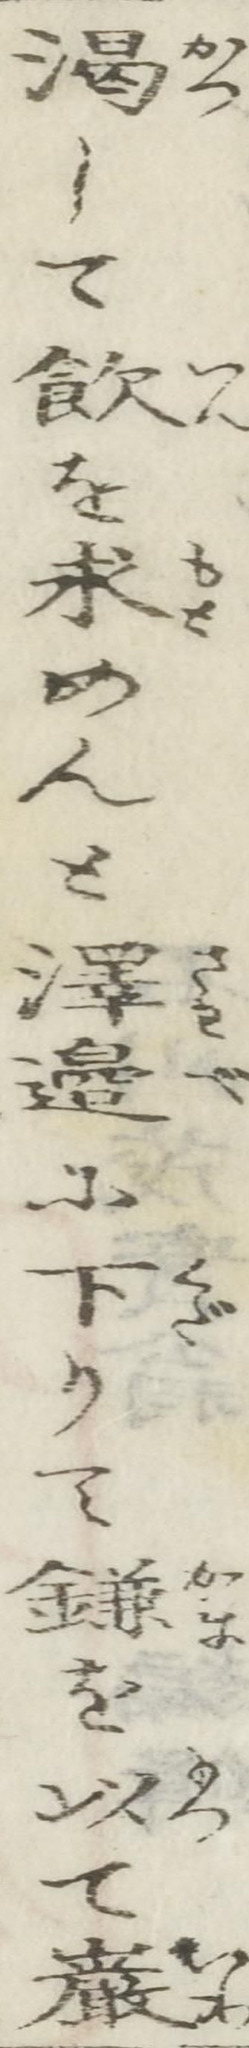渇して飲を求めんと沢辺に下りて鎌を以て巌
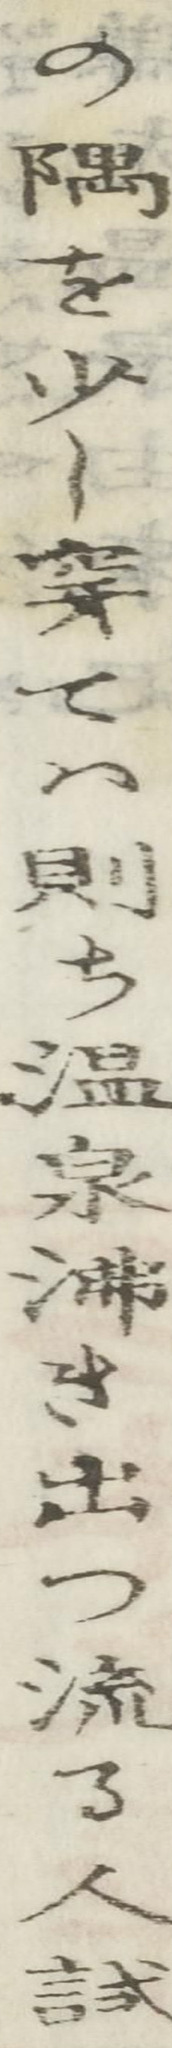の隅を少し穿ては則ち温泉沸き出つ流る人試
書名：鎌先温泉由來記
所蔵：東京大学地震研究所図書室 Earthquake Research Institute Library, The University of Tokyo, JAPAN
